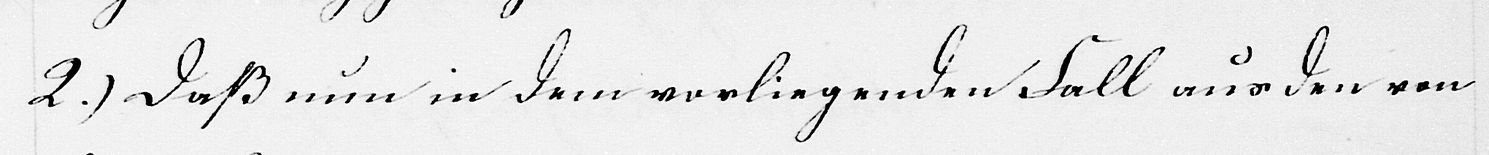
2.) Daß nun in dem vorliegenden Fall aus den von
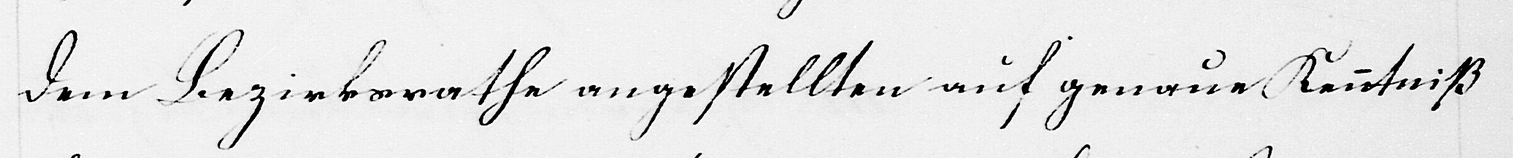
dem Bezirksrathe angestellten auf genaue Kenntniß
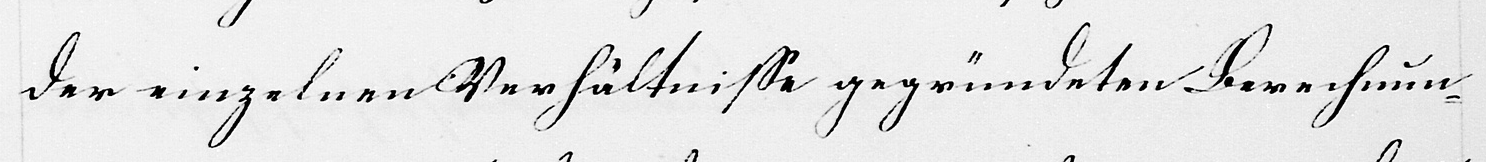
der einzelnen Verhältniße gegründeten Berechnun¬
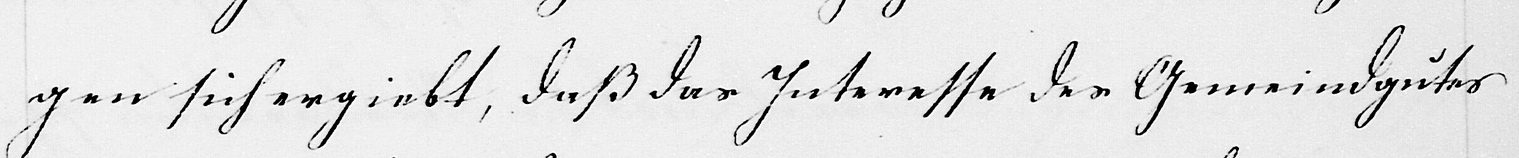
gen sich ergiebt, daß das Interesse des Gemeindgutes
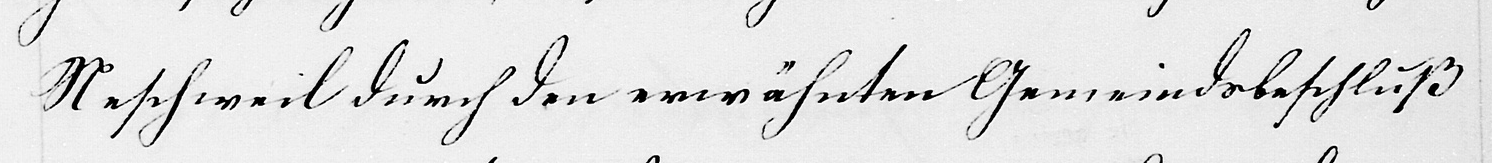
Neschweil durch den erwähnten Gemeindsbeschluß
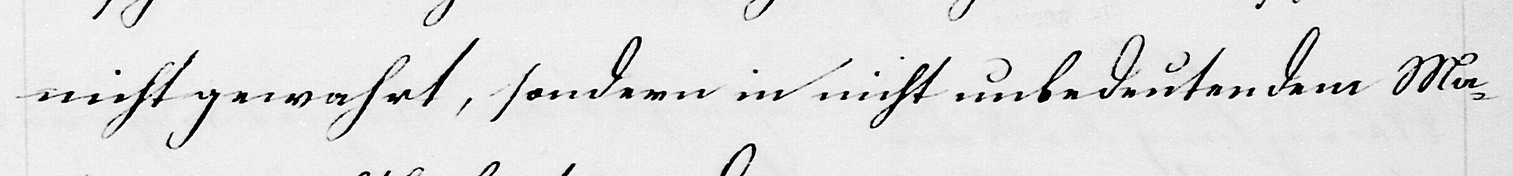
nicht gewahrt, sondern in nicht unbedeutendem Ma¬
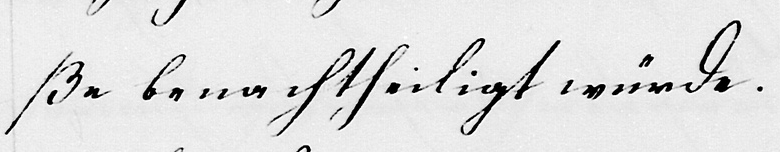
ße benachtheiligt würde.
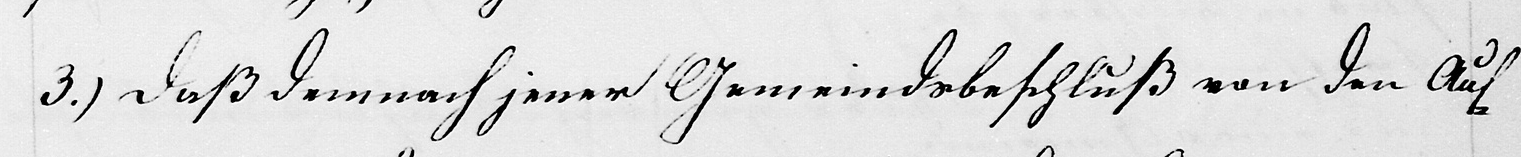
3.) Daß demnach jener Gemeindsbeschluß von den Auf¬
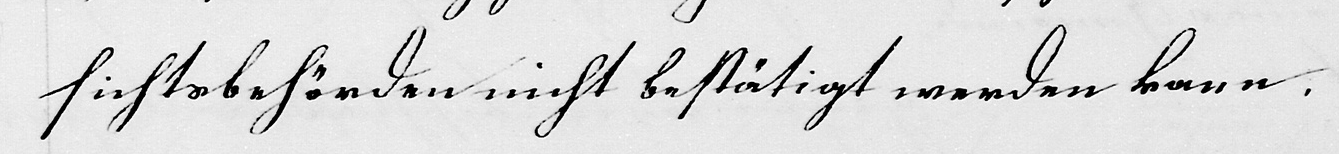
sichtsbehörden nicht bestätigt werden kann.
